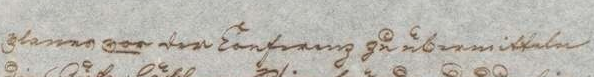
planes vor der Conferenz zu übermitteln
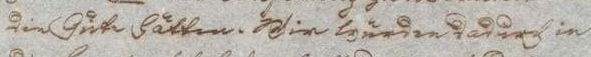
die Güte hätten. Wir würden dadurch in
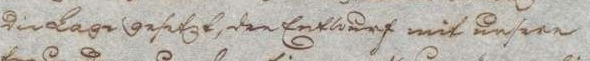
die Lage gesetzt, den Entwurf mit unsern
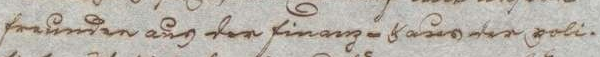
Freunden aus der Finanz- & aus der poli-
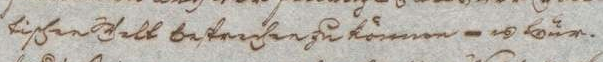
tischen Welt besprechen zu können – es wür-
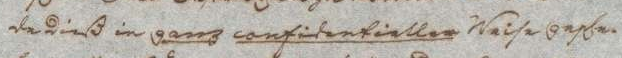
de dieß in ganz confidentieller Weise gesche-
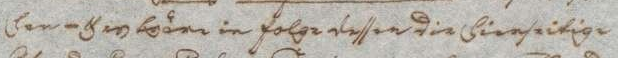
hen – & es wäre in Folge dessen die hierseitige
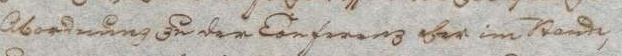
Abordnung zu der Conferenz eher im Stande,
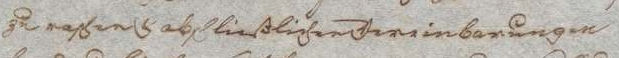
zu raschen & abschließlichen Vereinbarungen
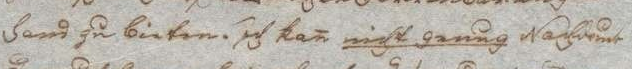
Hand zu bieten. Ich kann nicht genug Nachdruck
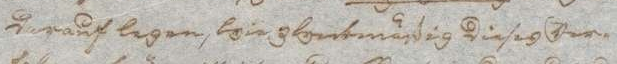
darauf legen, wie zweckmäßig dieses Ver-
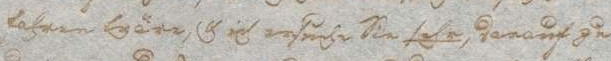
fahren wäre, & ich ersuche Sie sehr, darauf zu
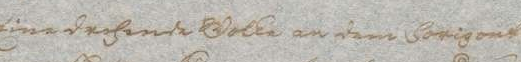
Eine drohende Wolke an dem Horizonte
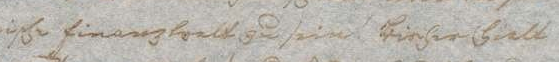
lienische Finanzwelt zu sein! Bisher hielt
